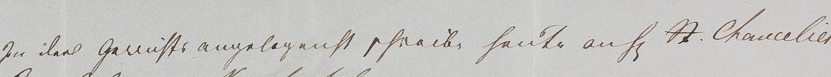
In der Gewichtsangelegenheit schreibe heute an Herrn St. Chancelier
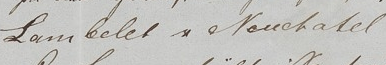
Lambelet v Neuchatel
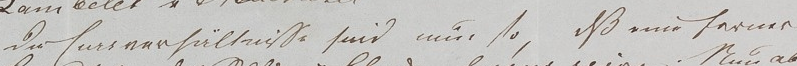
Die Cursverhältnisse sind nun so, dß eine fernere
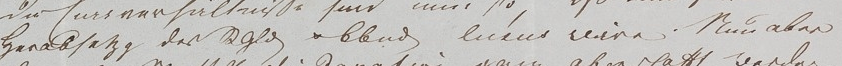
Herabsetzg des RGld & BBnd luxus wäre. Nun aber
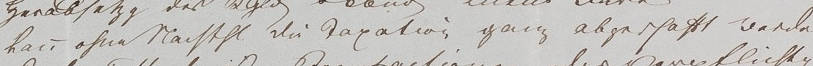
kann ohne Nachthl die Taxation ganz abgeschafft werden.
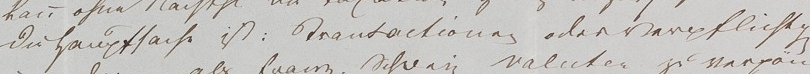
Die Hauptsache ist: Transactionen oder Verpflichtgen
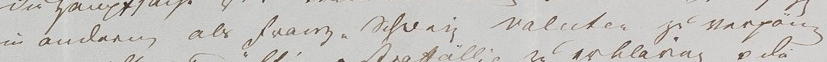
in andern als franz-Schweiz Valuten zu verpönen
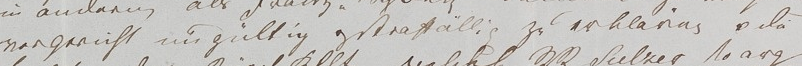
vor Gericht unglültig & straffällig zu erklären & die
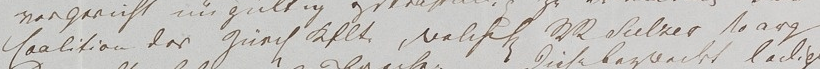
Coalition des Zürch Kflte, welche Herr RR Sulzer so arg
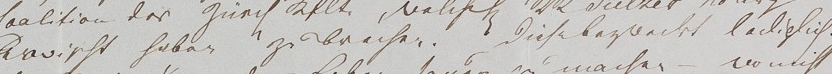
erwischt haben zu brechen. Diese bezweckt lediglich:
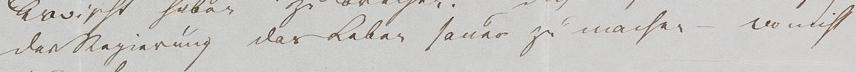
der Regierung das Leben sauer zu machen – wo nicht
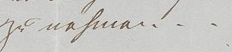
zu nehmen ...
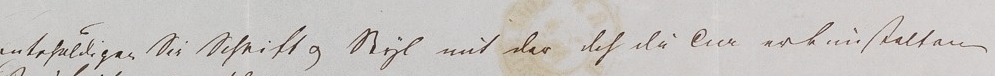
Entschuldigen Sie Schrift & Styl mit der dch die Cur erkünstelten
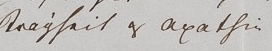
Trägheit & Apathie
